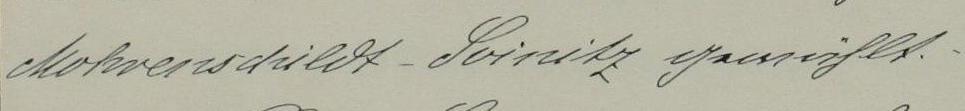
Mohrenschildt-Soinitz gewählt.
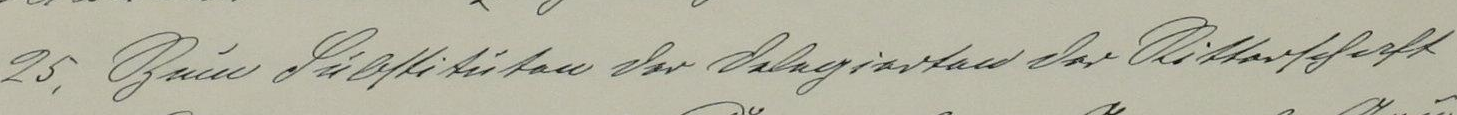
25. Zum Substituten der Delegierten der Ritterschaft
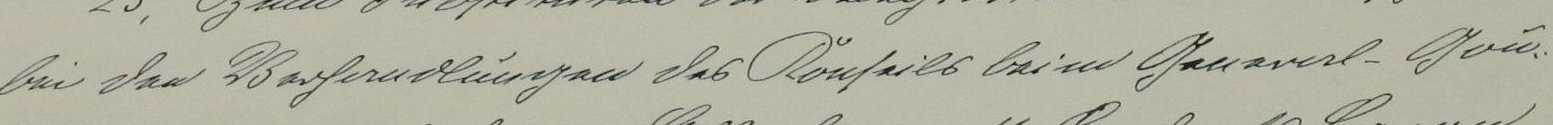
bei den Verhandlungen des Konseils beim General-Gou-
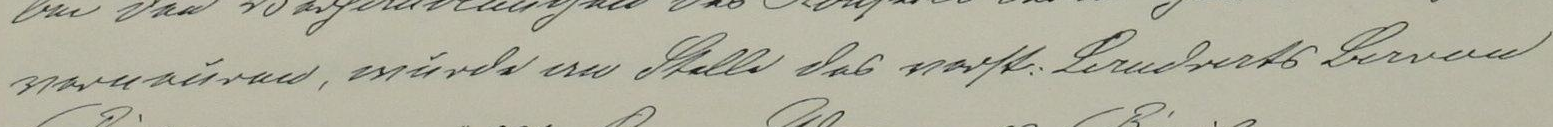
verneuren, wurde an Stelle des verst. Landrats Baron
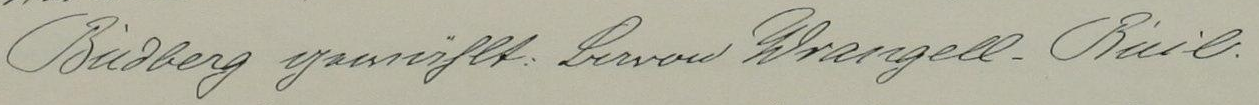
Budberg gewählt: Baron Wrangell-Ruil.
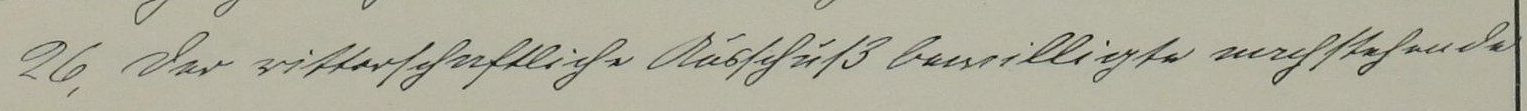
26. Der ritterschaftliche Ausschuß bewilligte nachstehende
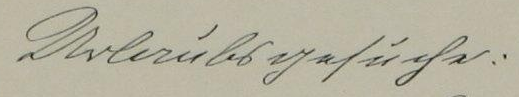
Urlaubsgesuche:
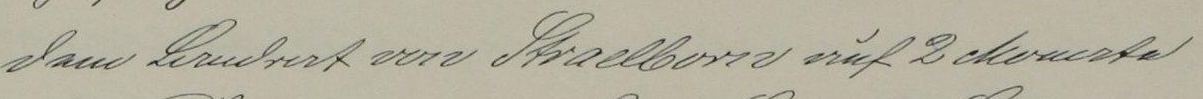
dem Landrat von Straelborn auf 2 Monate
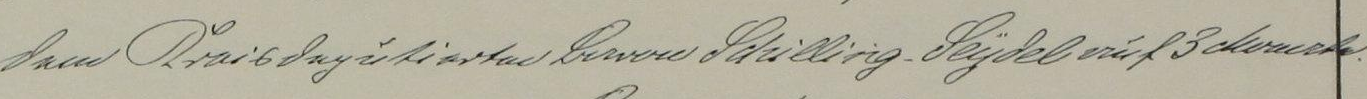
dem Kreisdeputierten Baron Schilling-Seydel auf 3 Monate.
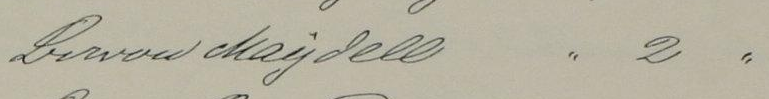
Baron Maydell " 2 "
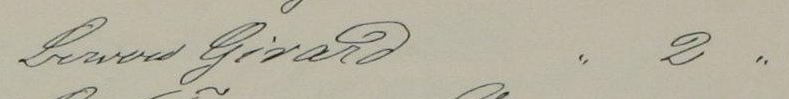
Baron Girard " 2 "
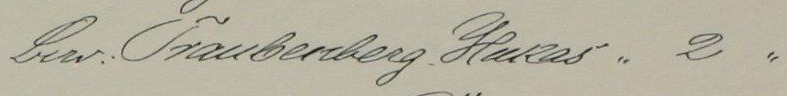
Bar. Traubenberg-Hukas " 2 "
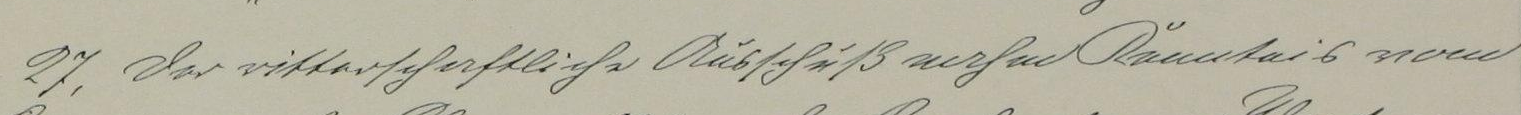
27. Der ritterschaftliche Ausschuß nahm Kenntnis vom
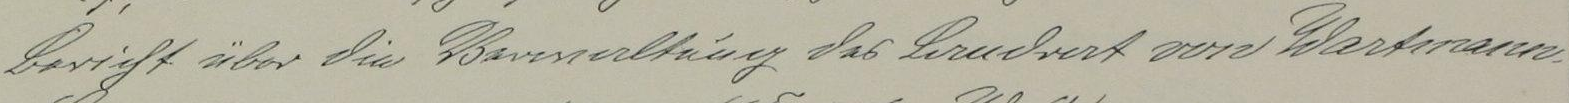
Bericht über die Verwaltung des Landrat von Wartmann-
